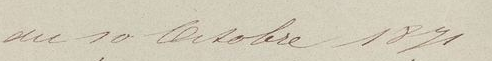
du 10 Octobre 1871
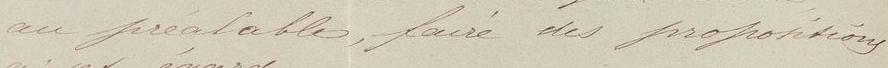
au préalable, faire des propositions
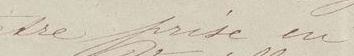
être prise en
